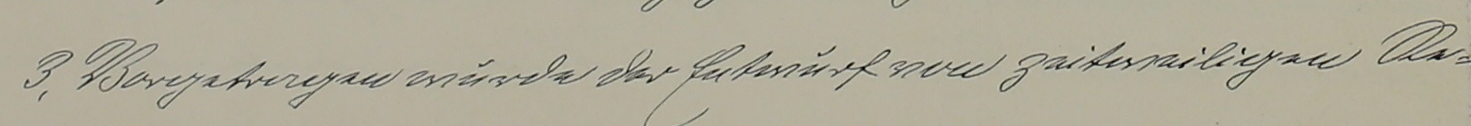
3. Vorgetragen wurde der Entwurf von zeitweiligen Re-
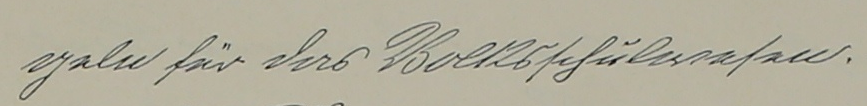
geln für das Volksschulwesen.
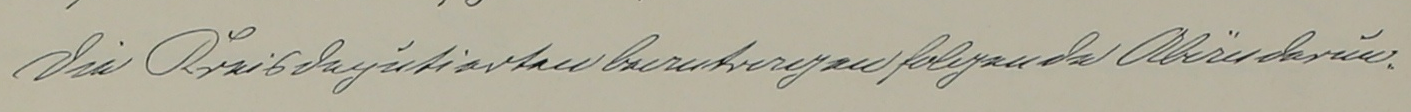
Die Kreisdeputierten beantragen folgende Abänderun-
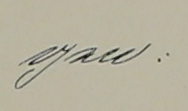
gen:
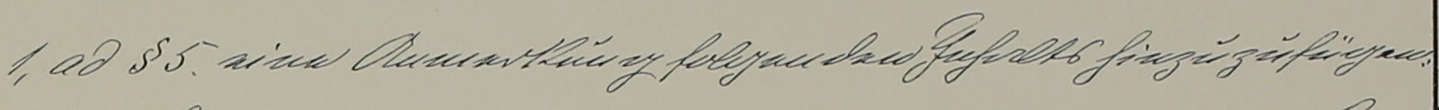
1. ad § 5. eine Anmerkung folgenden Inhalts hinzuzufügen:
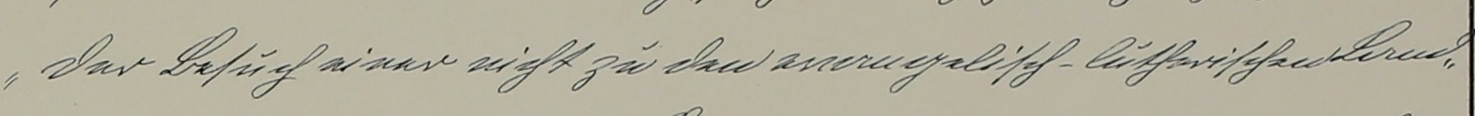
„Der Besuch einer nicht zu den evangelisch-lutherischen Land-
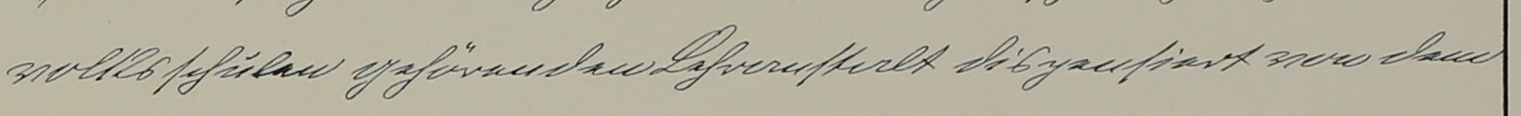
volksschulen gehörenden Lehranstalt dispensiert von dem
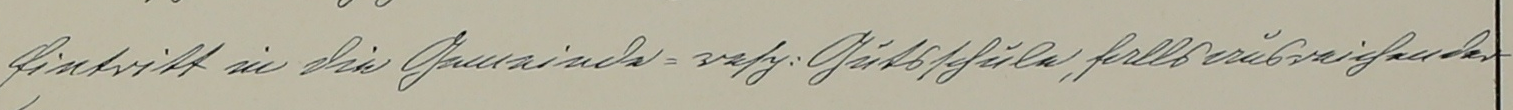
Eintritt in die Gemeinde- resp. Gutsschule, falls ausreichender
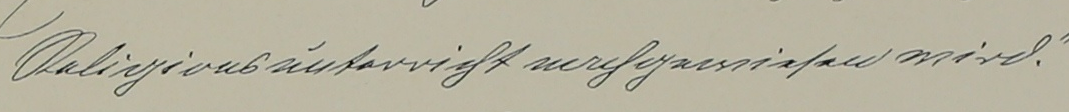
Religionsunterricht nachgewiesen wird.“
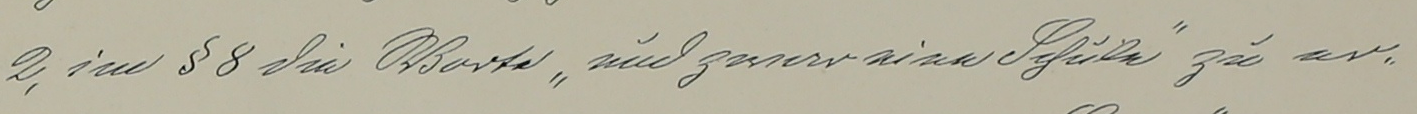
2. im § 8 die Worte „und zuvor eine Schule“ zu er-
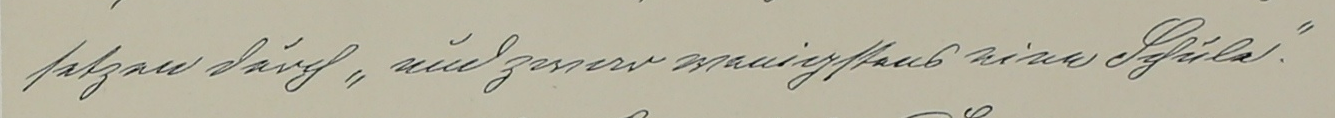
setzen durch „und zuvor wenigstens eine Schule.“
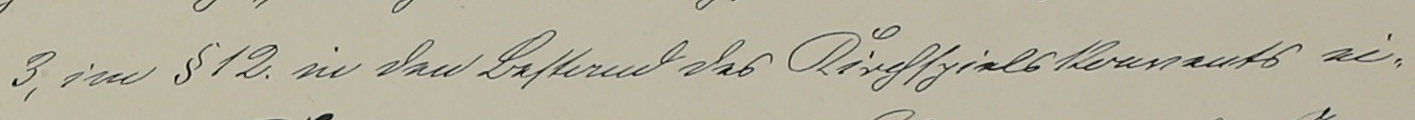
3. im § 12. in den Bestand des Kirchspielskonvents ei-
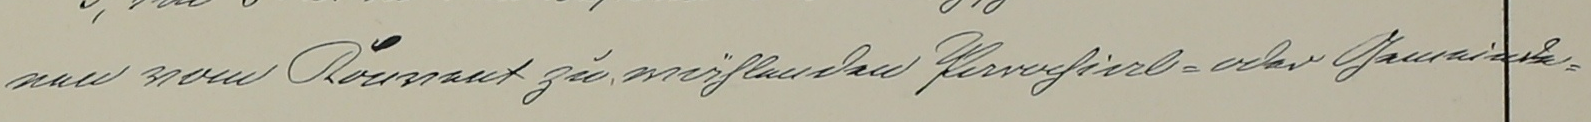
nen vom Konvent zu wählenden Parochial- oder Gemeinde-
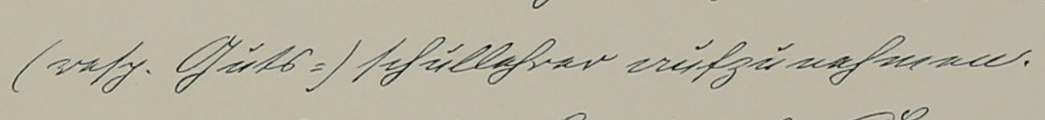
(resp. Guts-)schullehrer aufzunehmen.
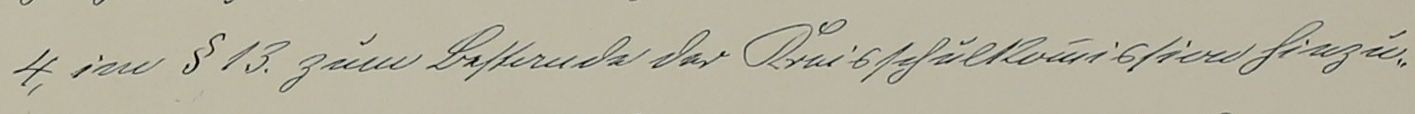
4. im § 13. zum Bestande der Kreisschulkommission hinzu-
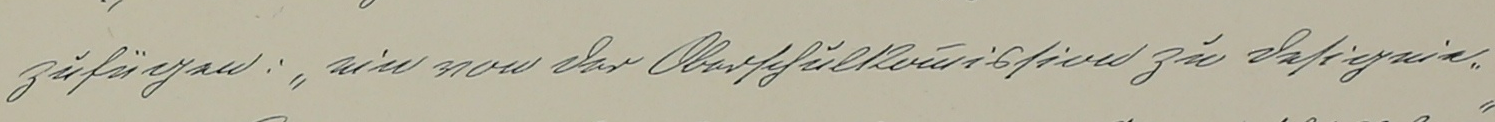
zufügen: „ein von der Oberschulkommission zu designie-
